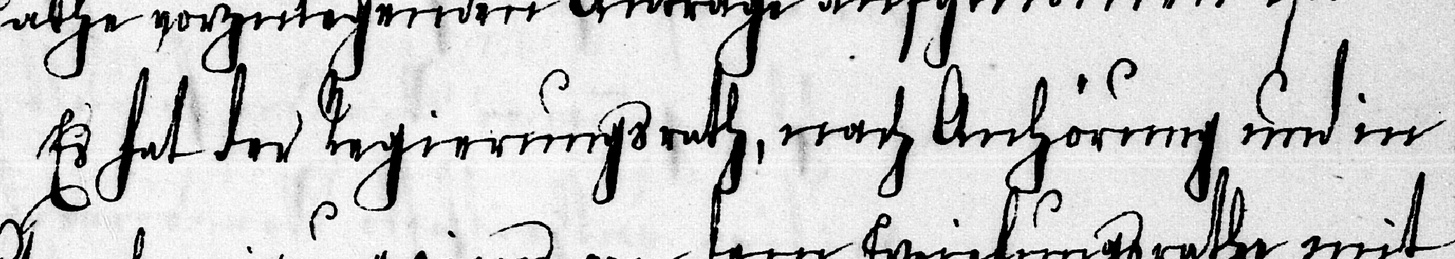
Es hat der Regierungsrath, nach Anhörung und in
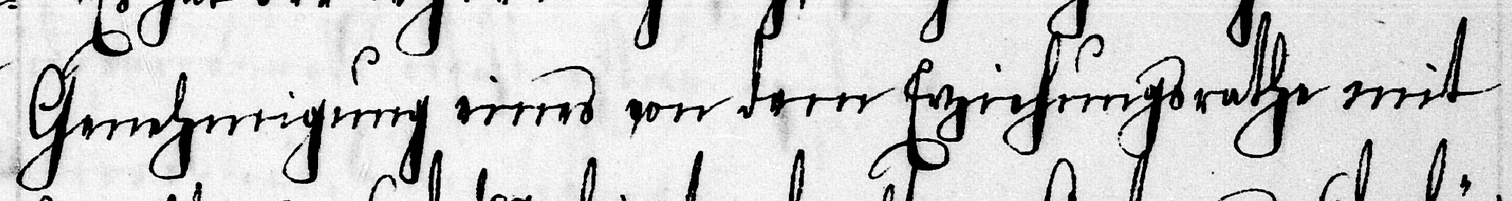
Genehmigung eines von dem Erziehungsrathe mit
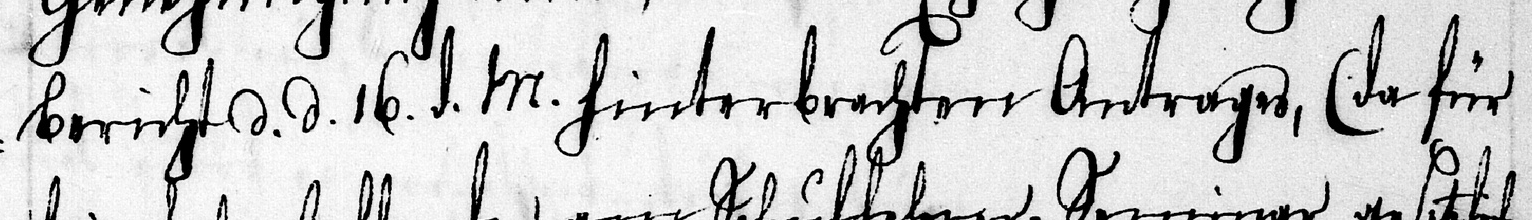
Bericht d. d. 16. d. M. hinterbrachten Antrages, (da für
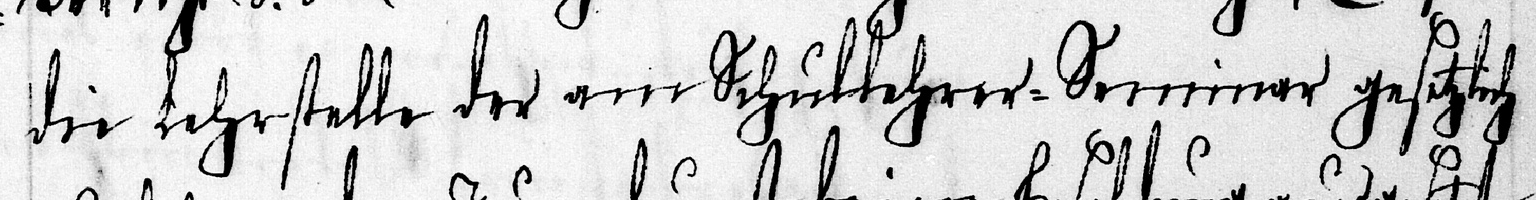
die Lehrstelle der am Schullehrer-Seminar gesetzl¬
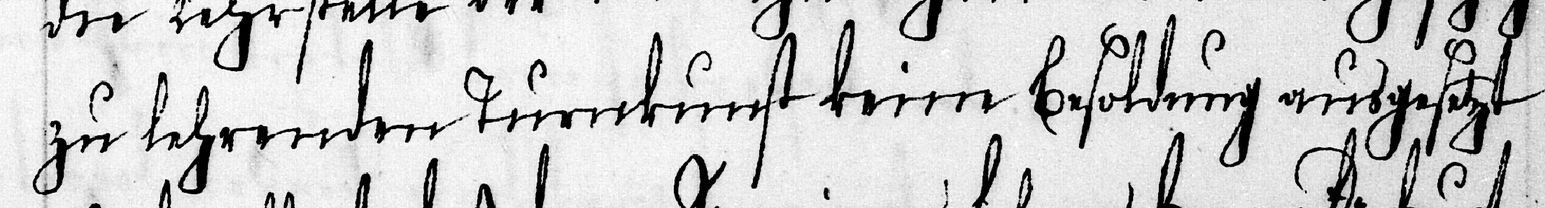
zu lehrenden Turnkunst keine Besoldung ausgesetzt
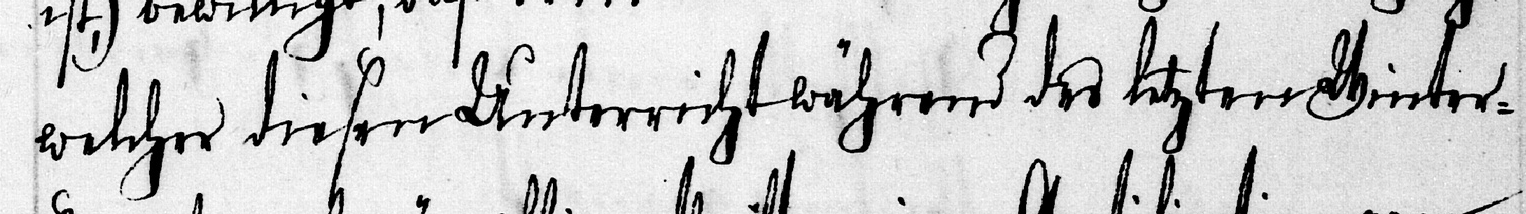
welcher diesen Unterricht während des letzten Winter¬
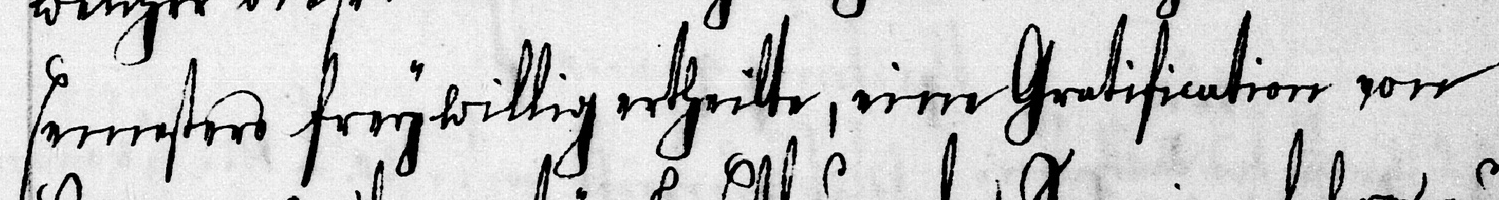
semesters freywillig ertheilte, eine Gratification von
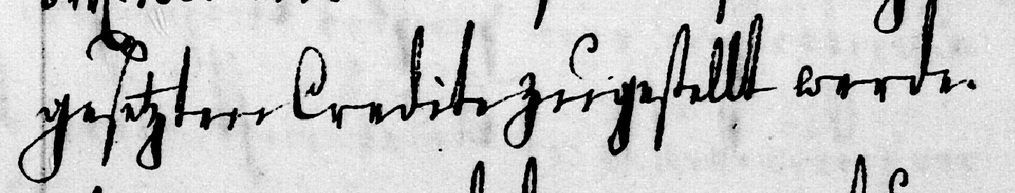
gesetzten Credite zugestellt werde.
